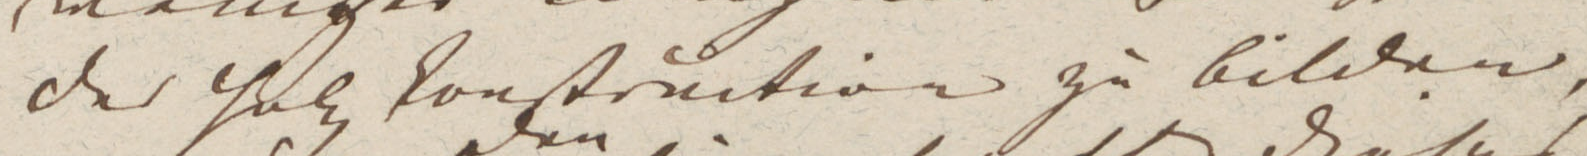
der Holzkonstruction zu bilden,
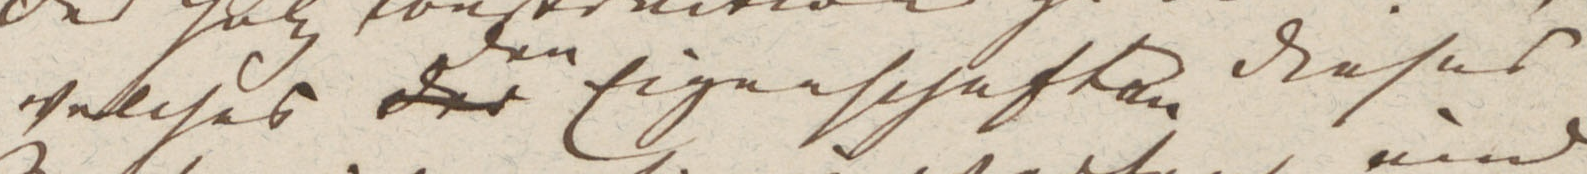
welches der den Eigenschaften dieses
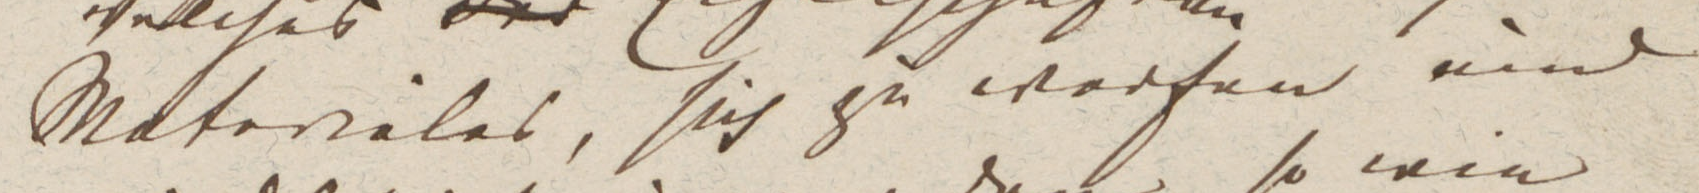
Materiales, sich zu werfen und
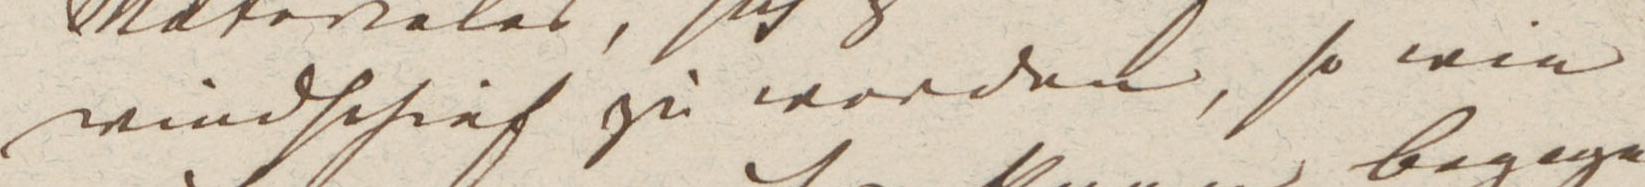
windschief zu werden, so wie
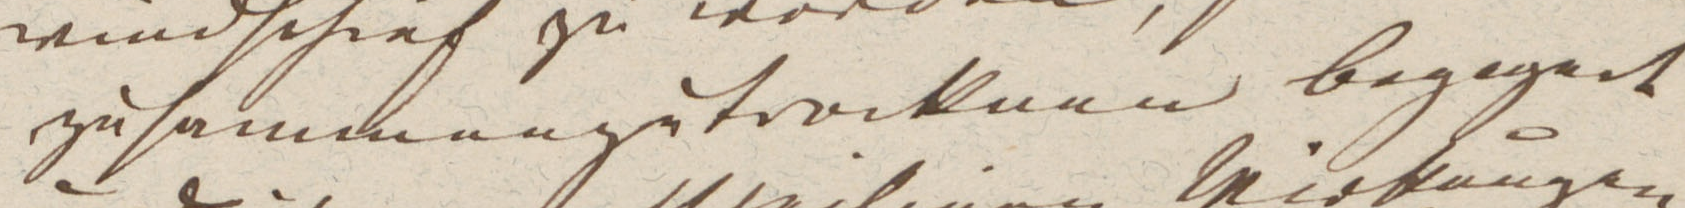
zusammenzutrocknen begegnet
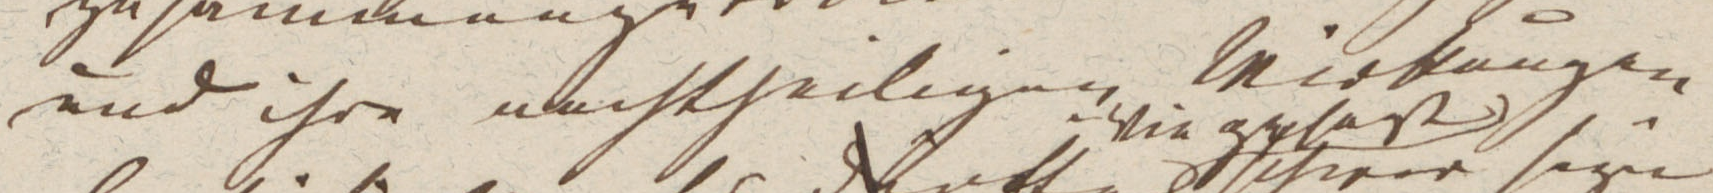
und ihre nachtheiligen Wirkungen
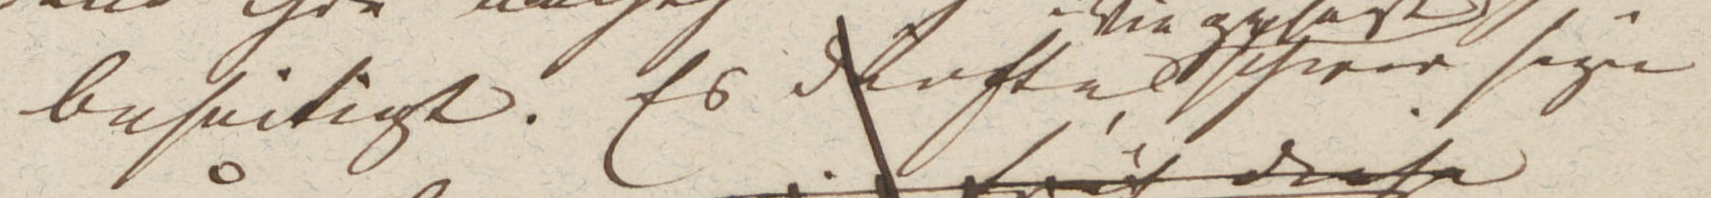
beseitigt. Es dürfte, wie gesagt schwer seyn
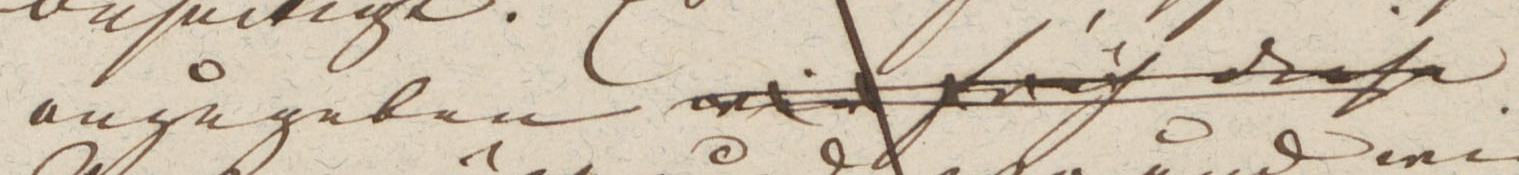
anzugeben wie früh diese
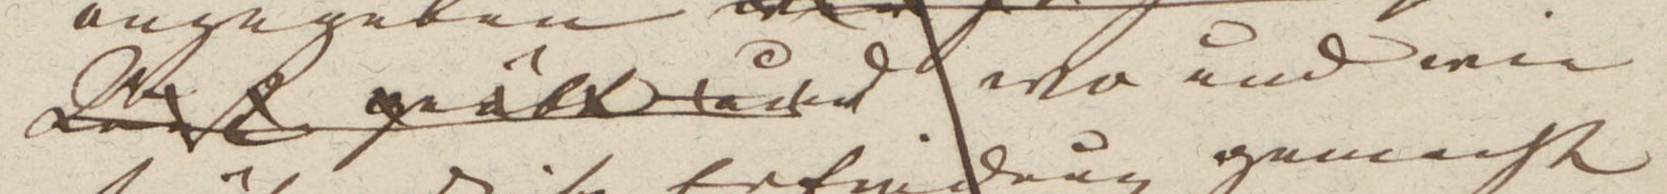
Kunst geübt und wo und wie
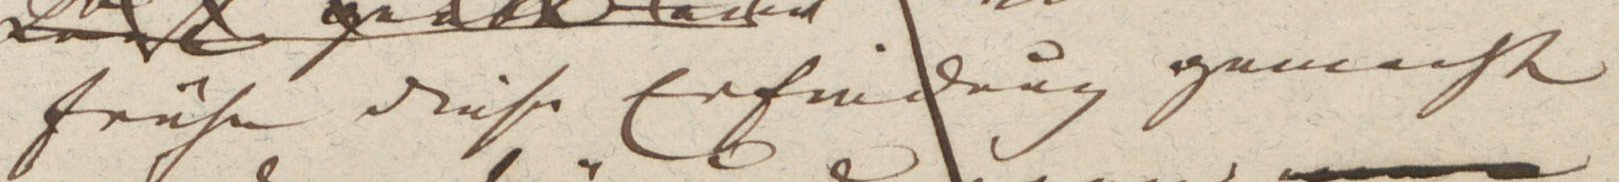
frühe diese Erfindung gemacht
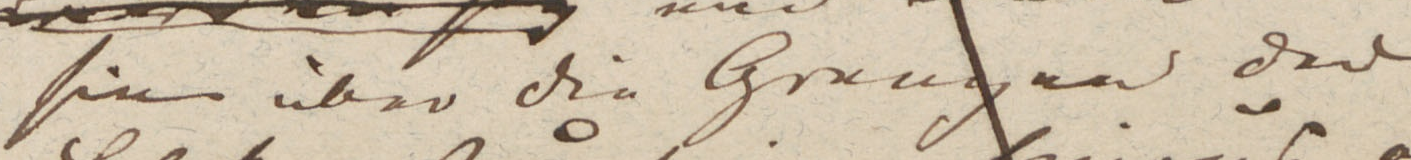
sie über die Grenzen der
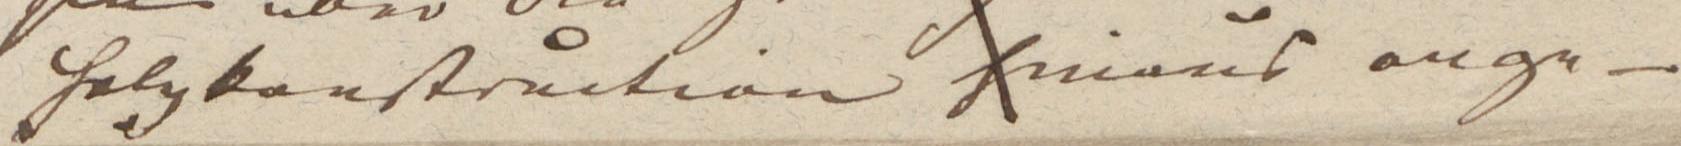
Holzkonstruction hinaus ange-
